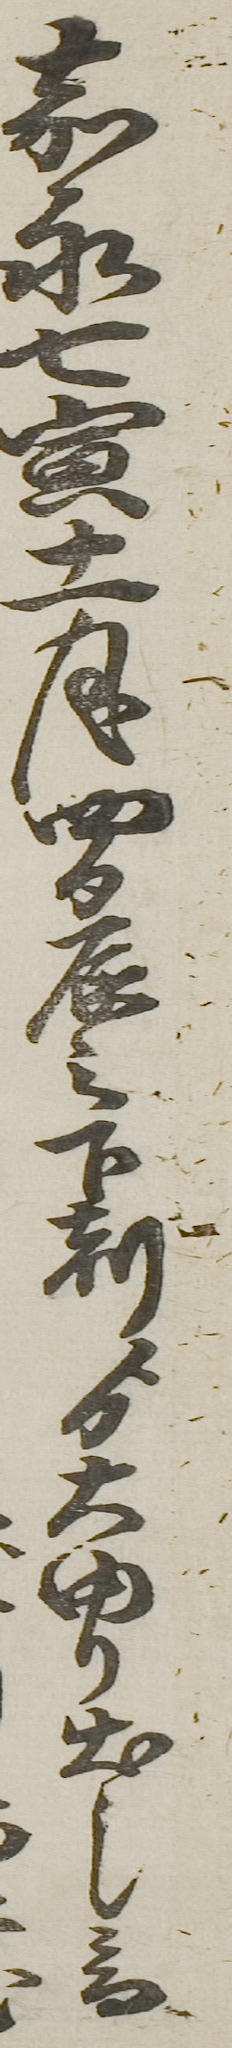嘉永七寅十一月四日辰之下刻より大ゆり出しにて
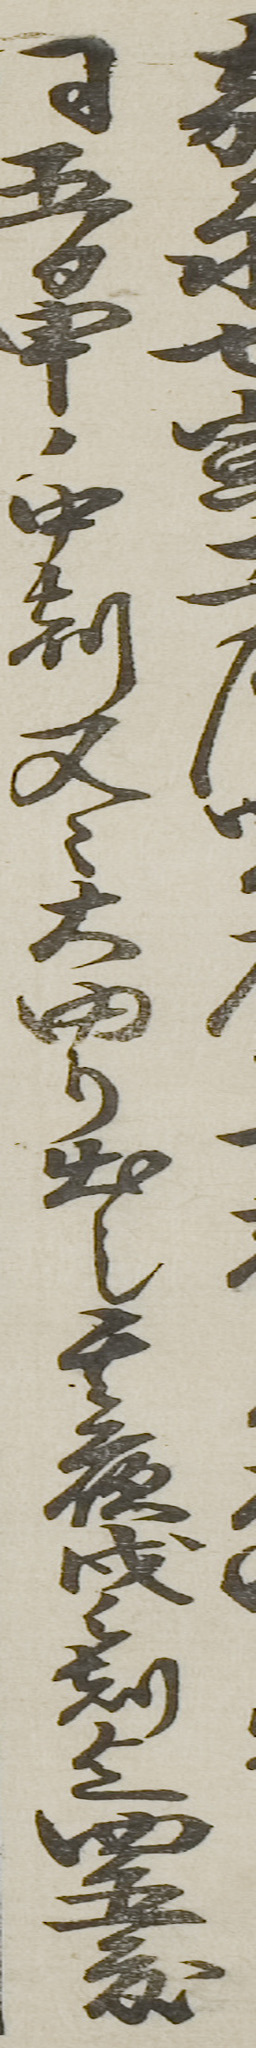同五日申ノ刻又々大ゆり出し其夜戌之刻迄四五度
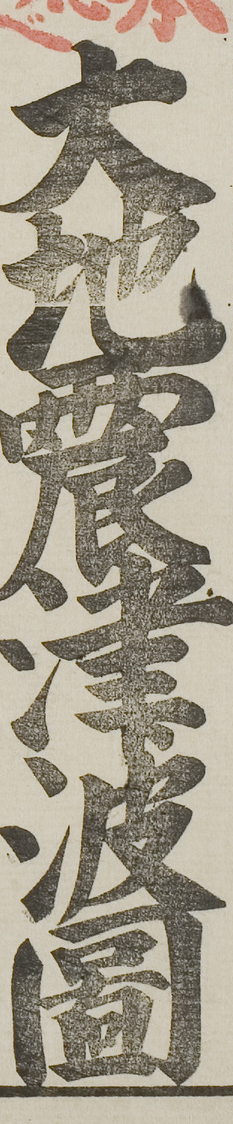大地震津波図
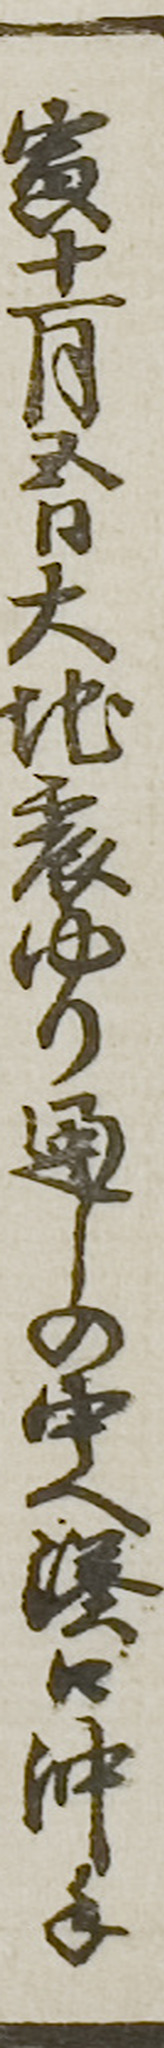寅十一月五日大地震ゆり通しの中へ湊口沖手
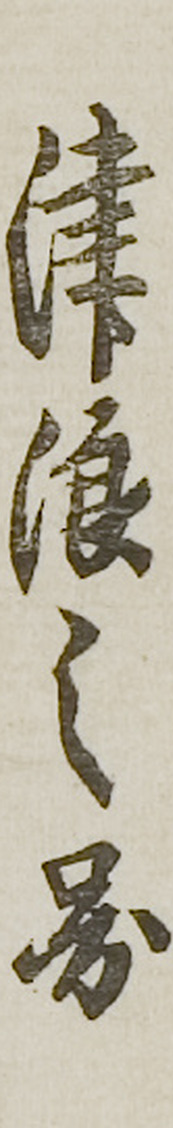津浪之図
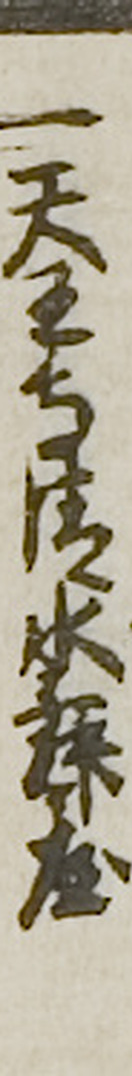一天王寺清水藤屋
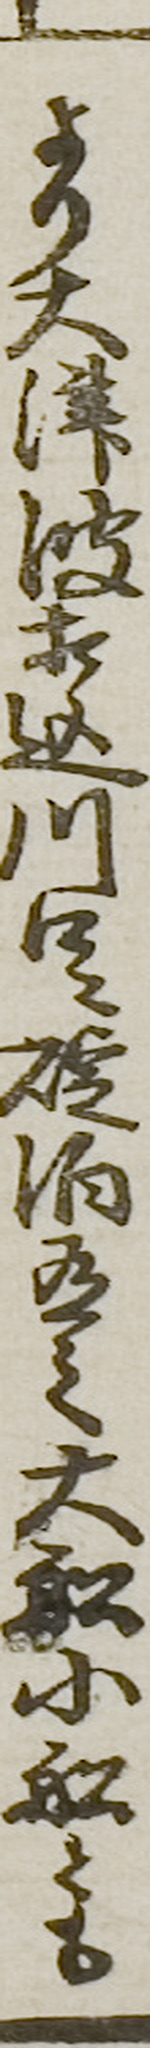より大津波打込川口に碇泊有之大船小船とも
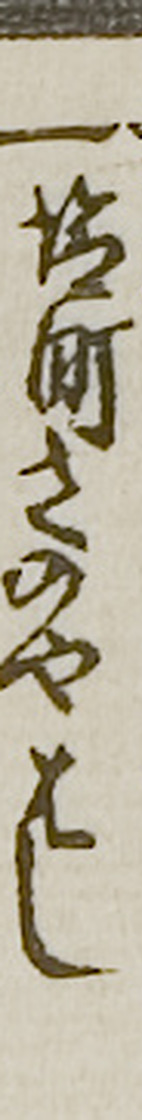一塩町さのやはし
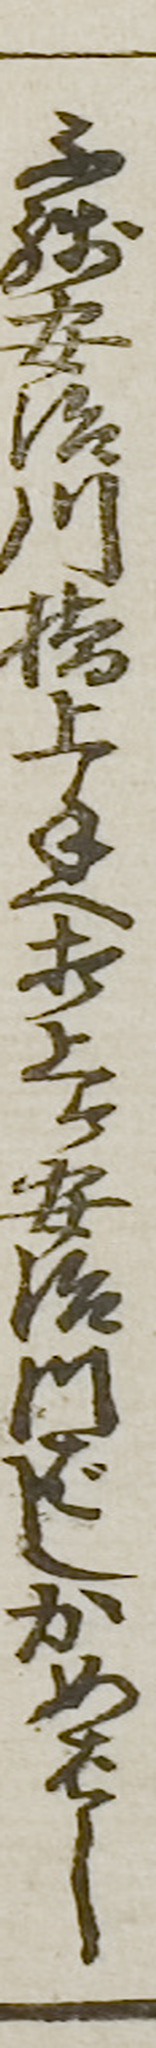不残安治川橋上手へ打上ケ安治川ばしかめばし
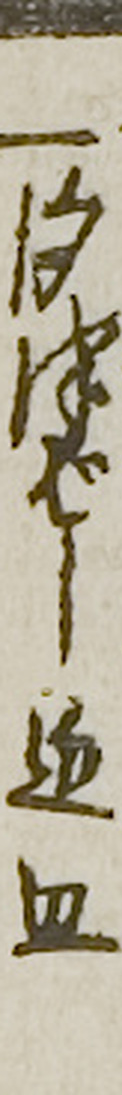一汐津ばし近辺
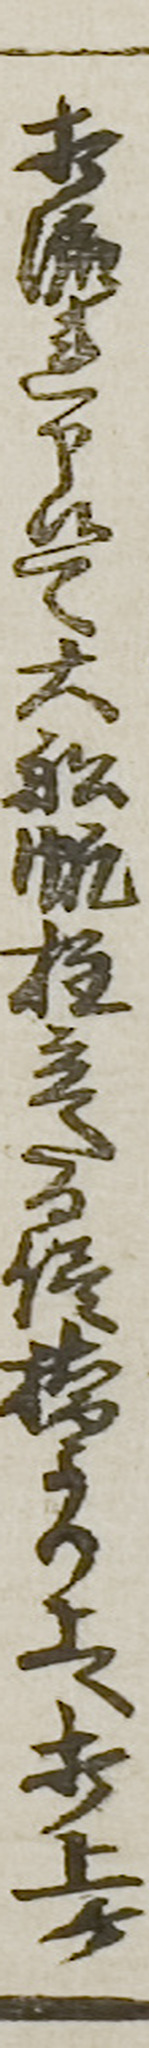打流れ申候て大船帆柱立たる侭橋より上へ打上ケ
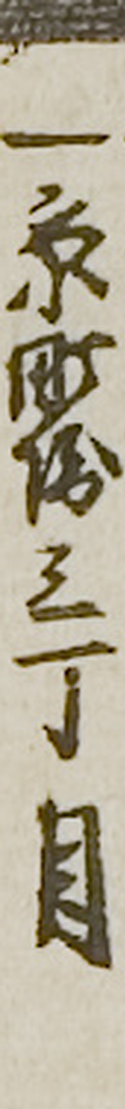一京町堀三丁目
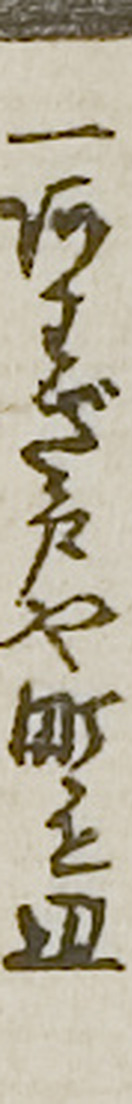一あわだ戸や町近辺
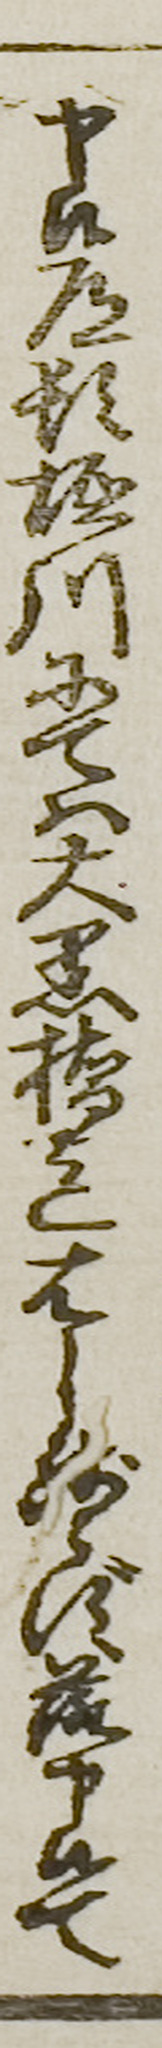申候道頓堀川にては大黒橋迄はし残らず落申候て
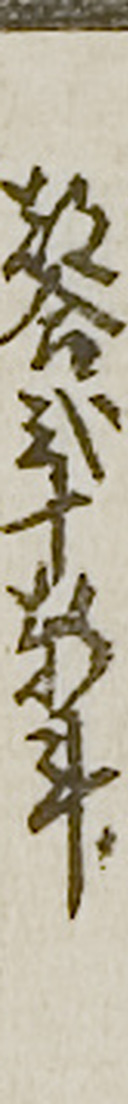都合弐十軒斗
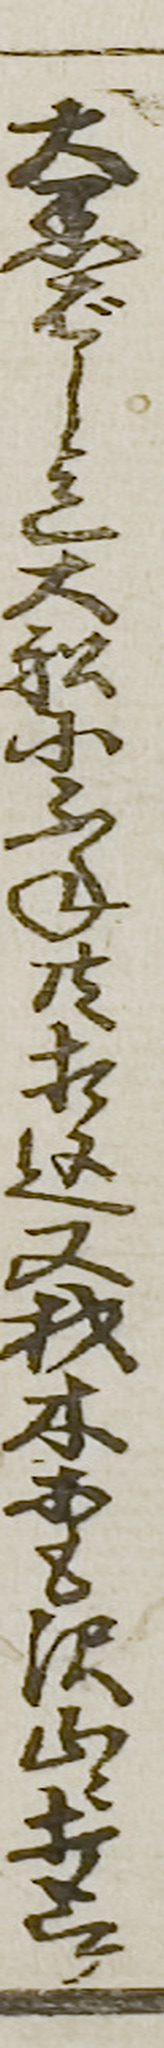大黒ばし迄大船小ふね共打込又材木等も沢山に打上ケ
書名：大坂辺東海道本しらべ大地震津波図
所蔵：東京大学総合図書館 General Library in the University of Tokyo, JAPAN
